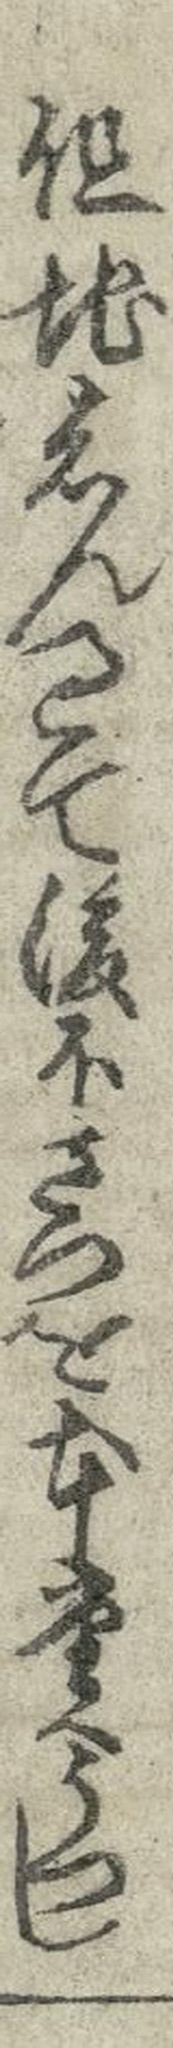但地しん過て後ほさつを本堂へうつし
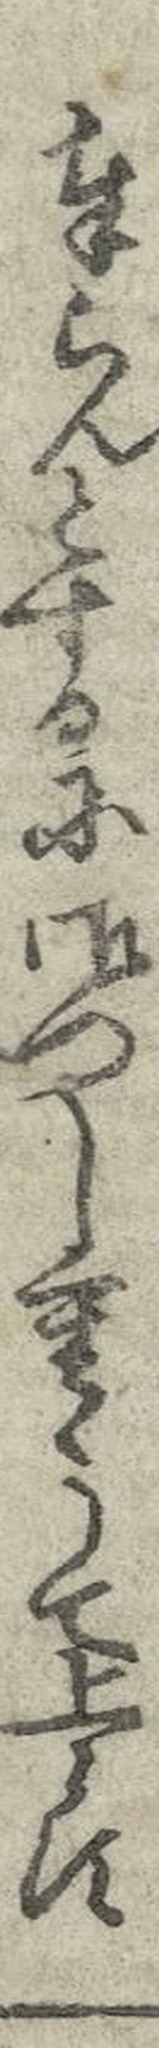奉らんとするに御つし重うて上らす
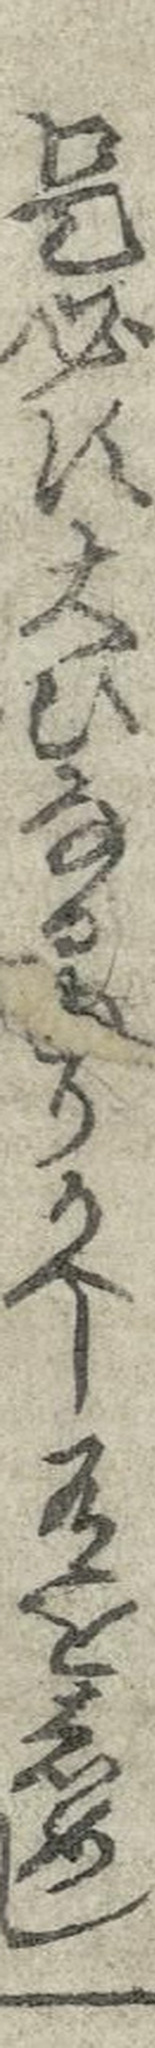是必す大ひなるゆりかへし有をしめし
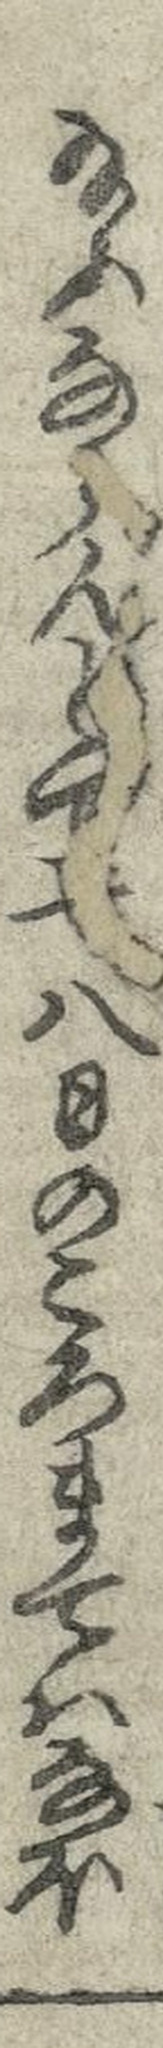給ふならんとて七八日のころまてはなほ
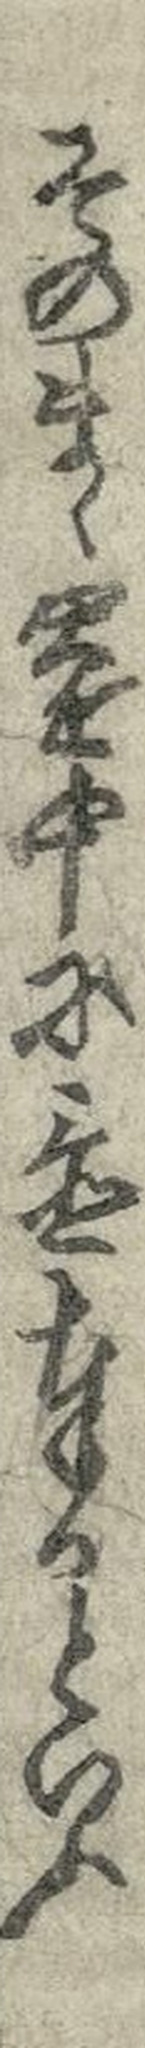そのまゝ園中に置奉るといふ

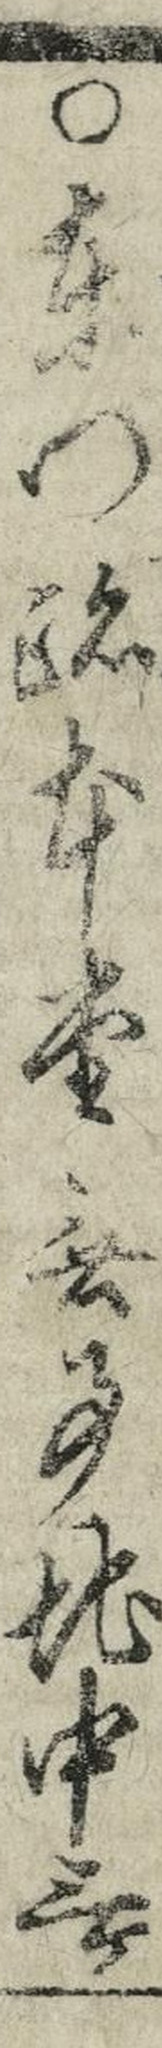○東門跡本堂無事地中三ヶ
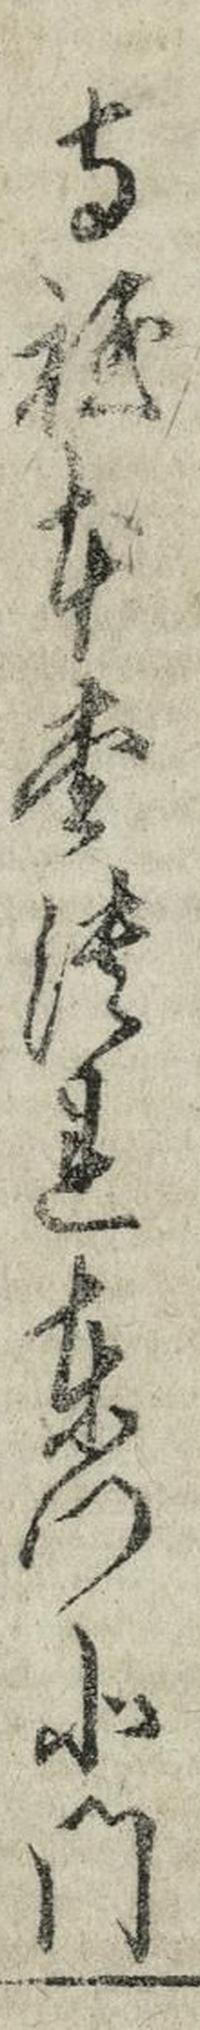寺程本堂潰れ東門北門
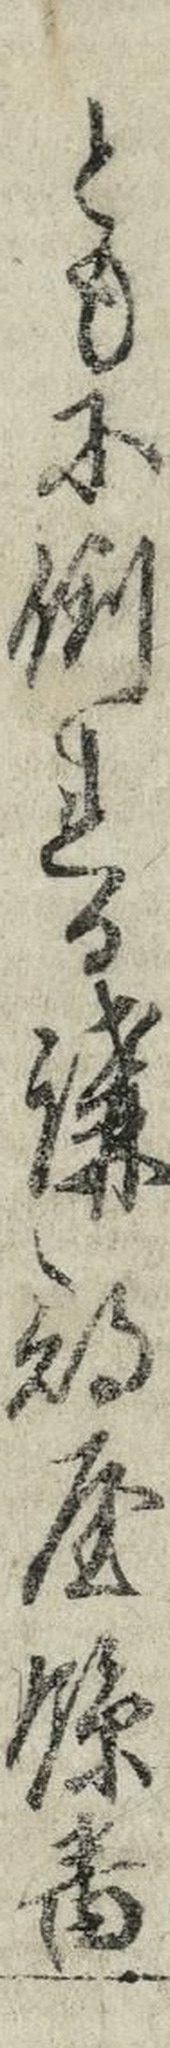ともに倒れる溝部屋臨番
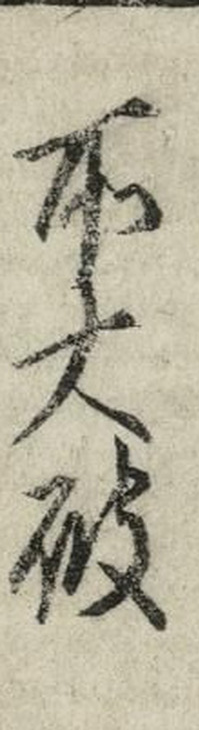所大破
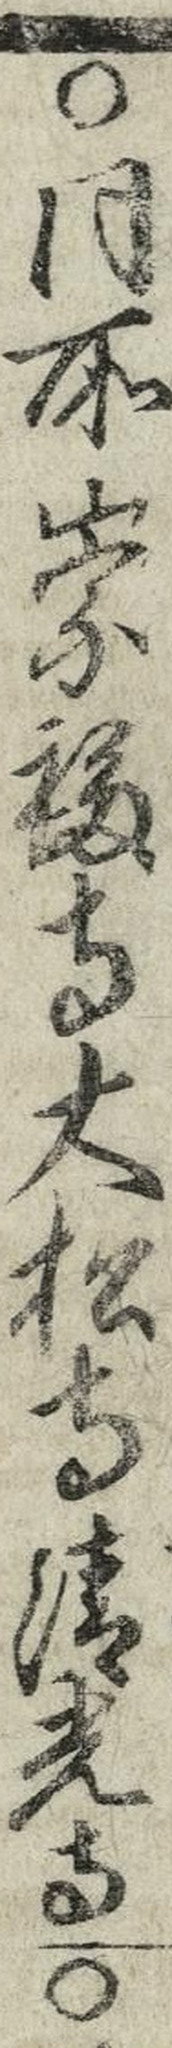○同所崇福寺大松寺清光寺
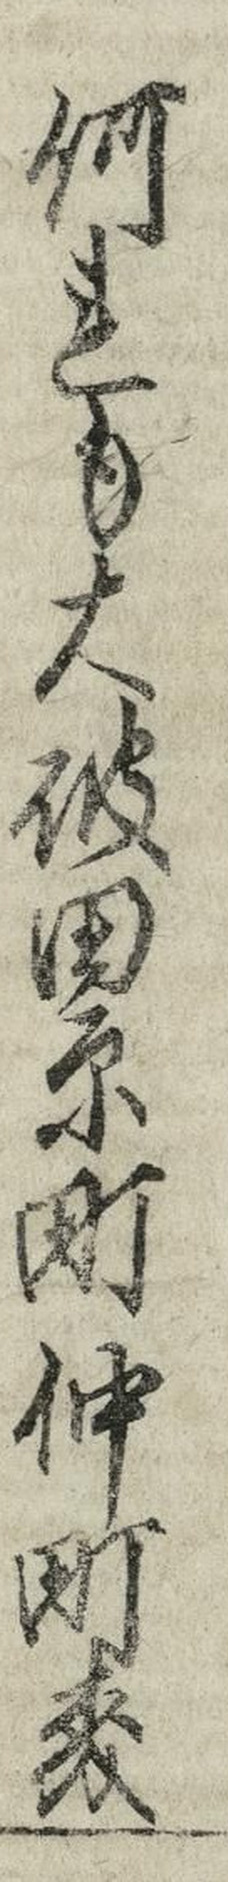何れも大破田原町仲町森
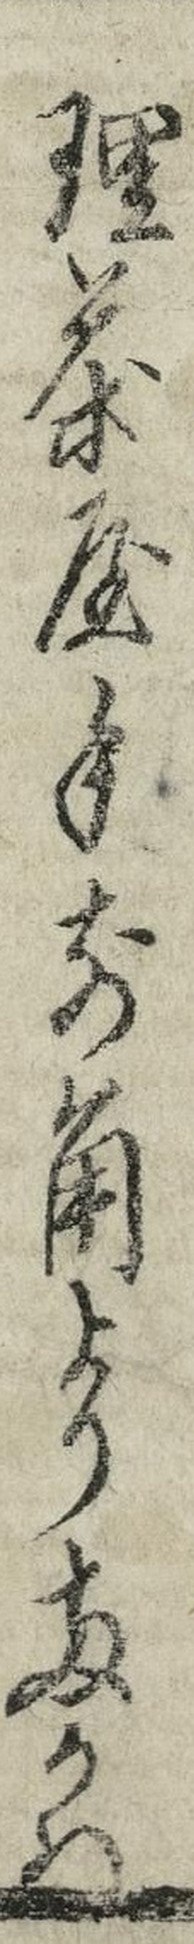理茶屋手前角より両かは
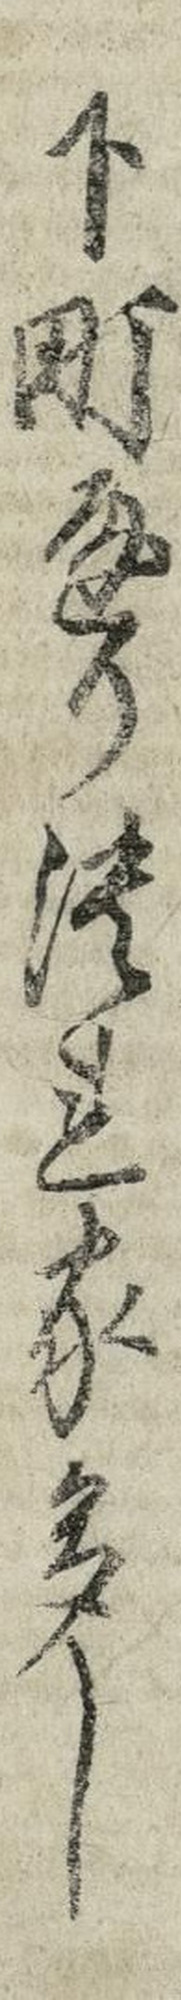下町通り潰れ家多し
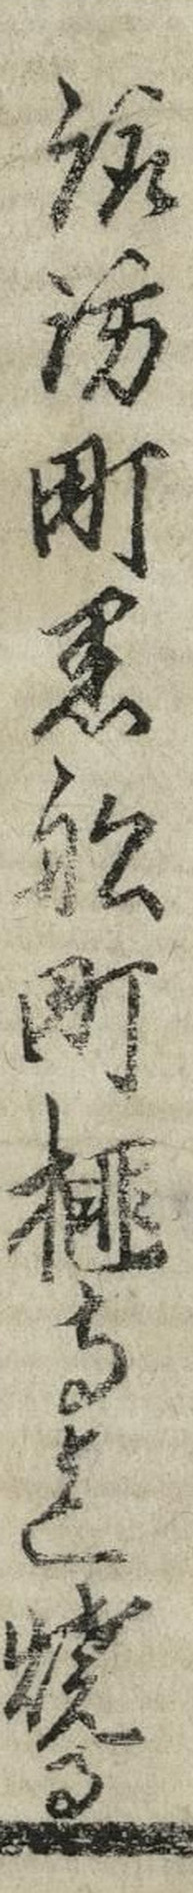諏訪町黒船町榧寺迄焼る
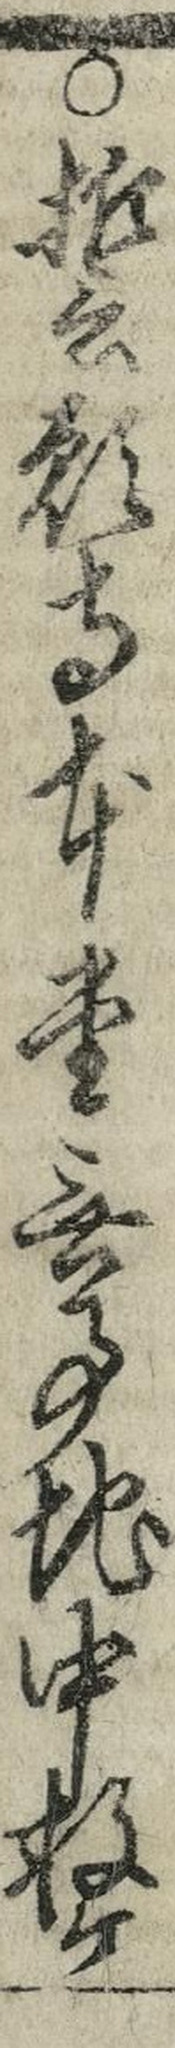○誓願寺本堂無事地中数ヶ
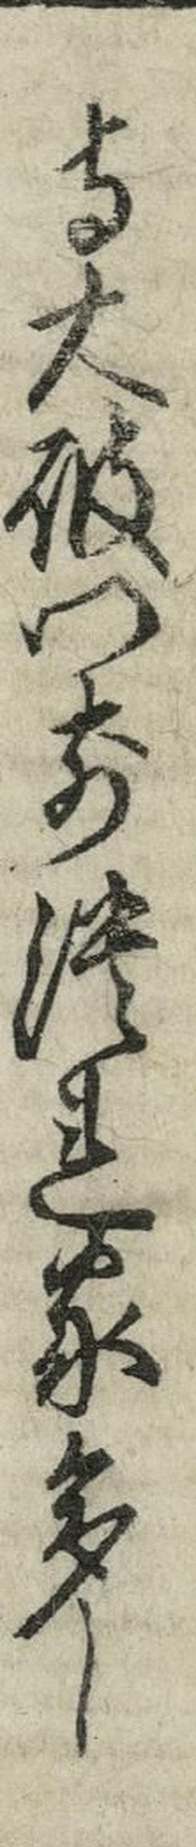寺大破門前潰れ家多し
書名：江戸　大地震末代噺の種　全
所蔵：東京大学地震研究所図書室 Earthquake Research Institute Library, The University of Tokyo, JAPAN
